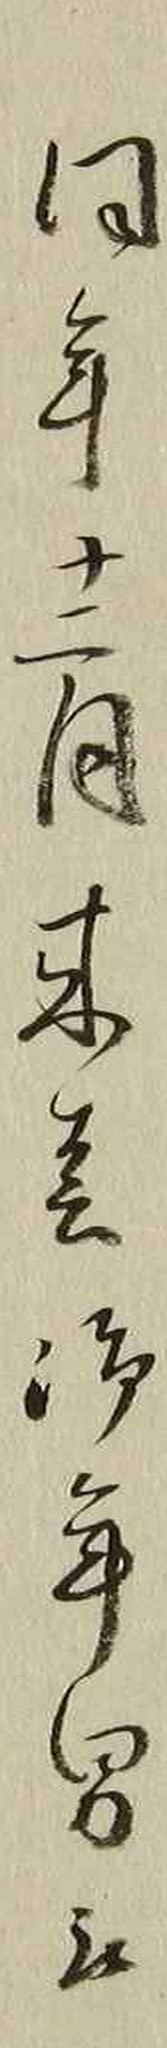一同年十二月来春御年男被
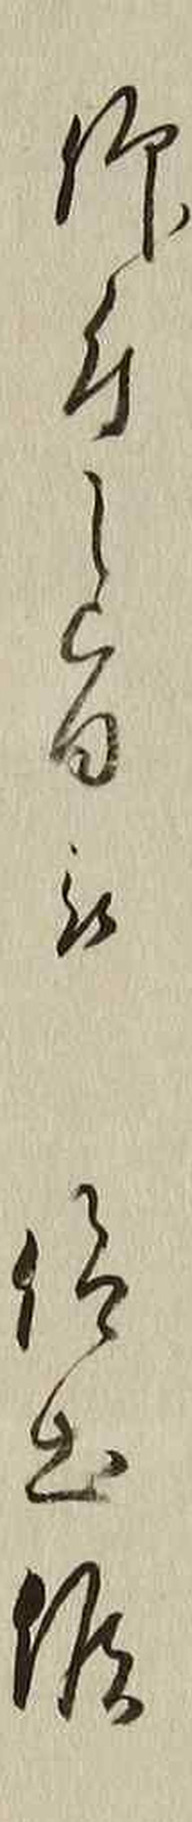仰付之旨被仰出候
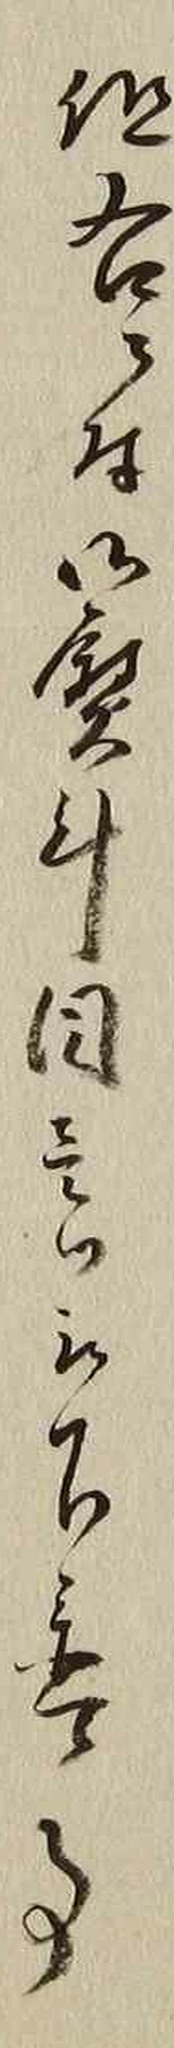但右ニ付御熨斗目壱ツ被下置候事
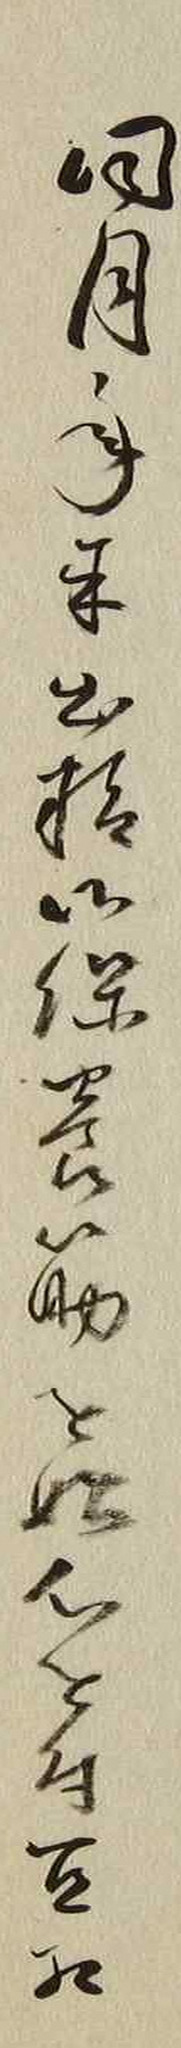一同月年来出精御保養筋を始心を付宜相
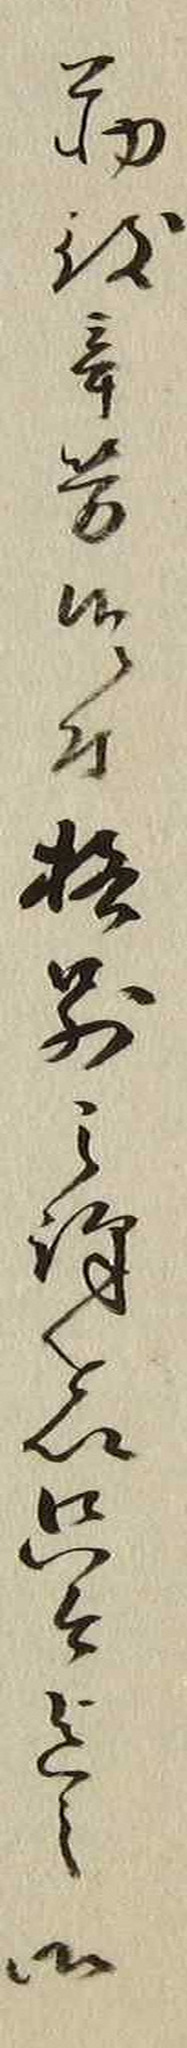勤致辛労候ニ付格別之訳を以只今迄之御
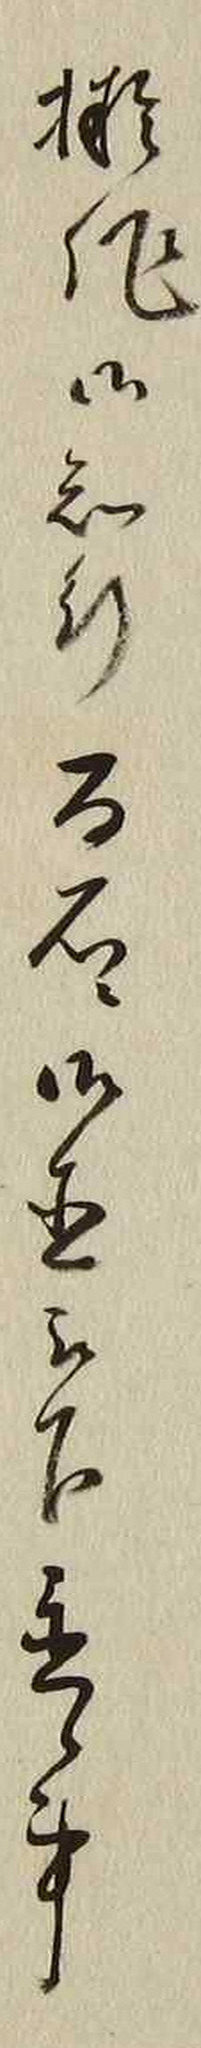擬作御知行百石ニ御直被下置候事
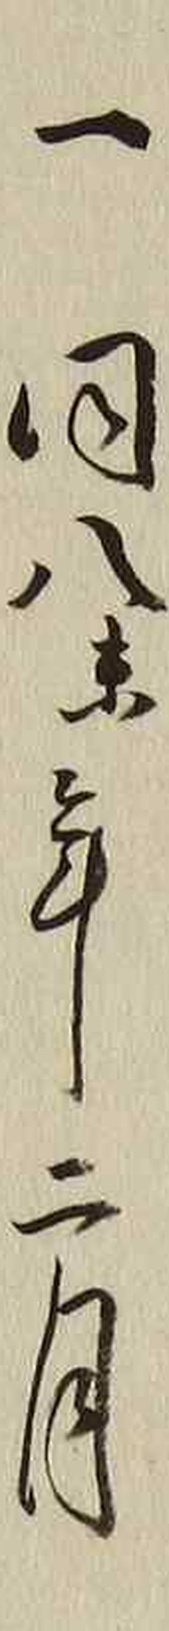一同八未年二月
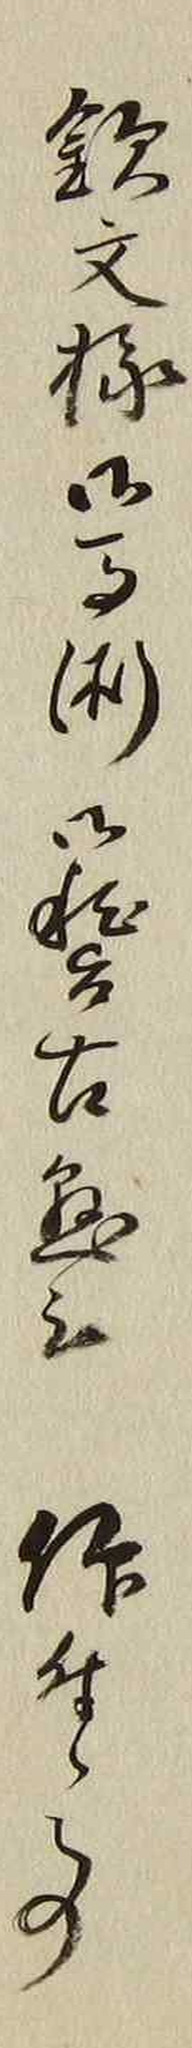欽文様御馬術御稽古懸被仰付候事
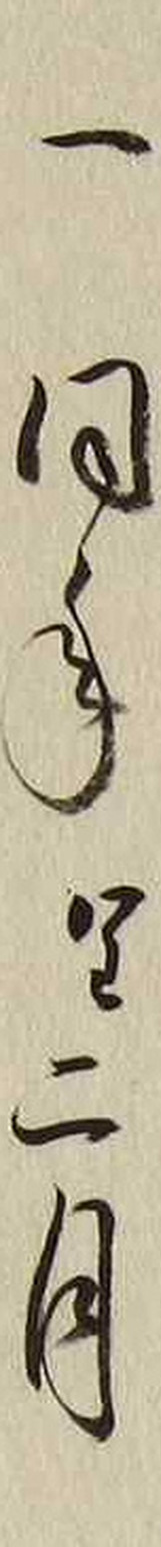一同年閏二月
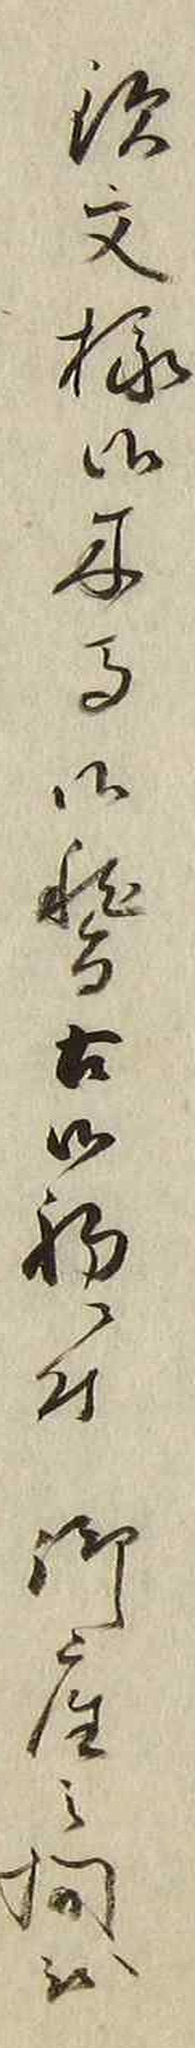欽文様御木馬御稽古御初ニ付御座之間へ被
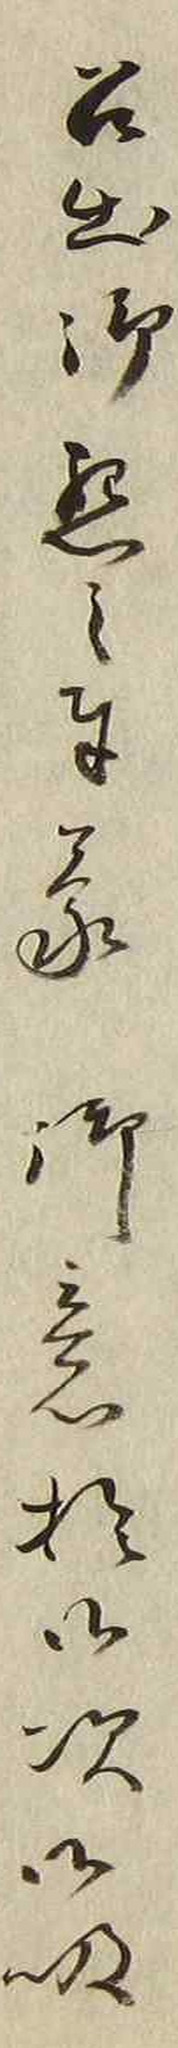召出御懇之奉蒙御意於御次御吸

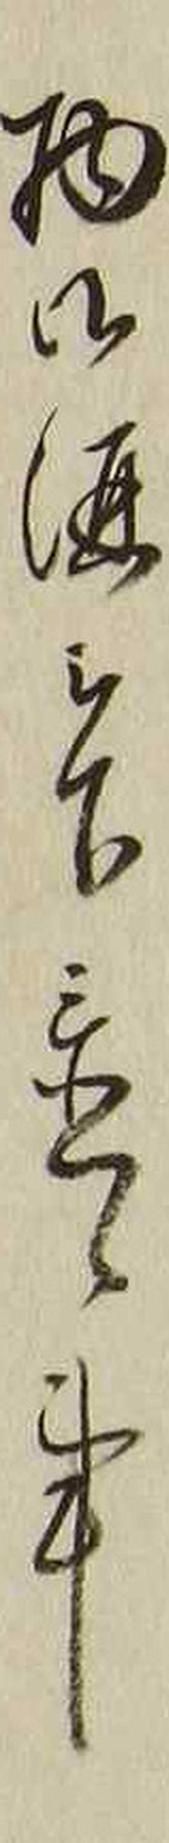物御酒被下置候事
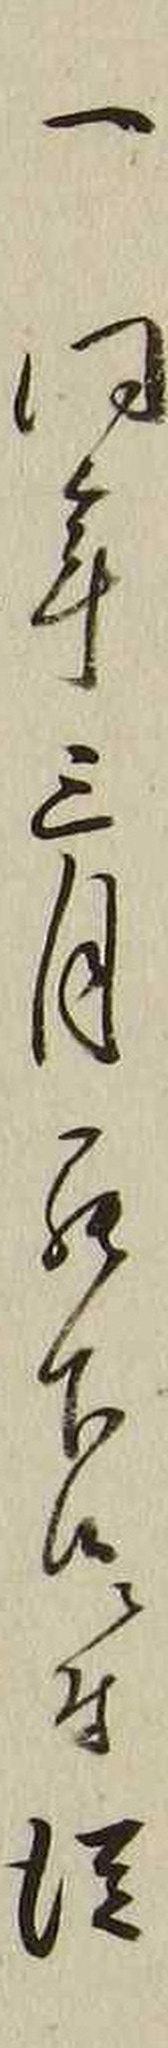一同年三月罷下候候ニ付従
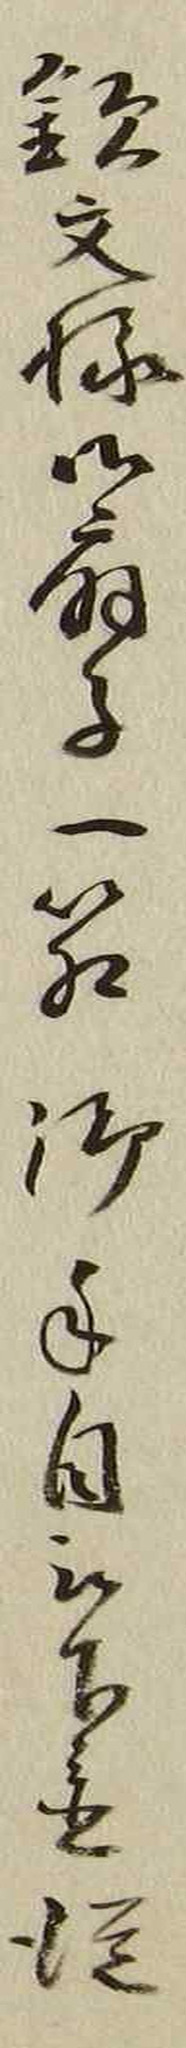欽文様御扇子一箱御手自被下置従
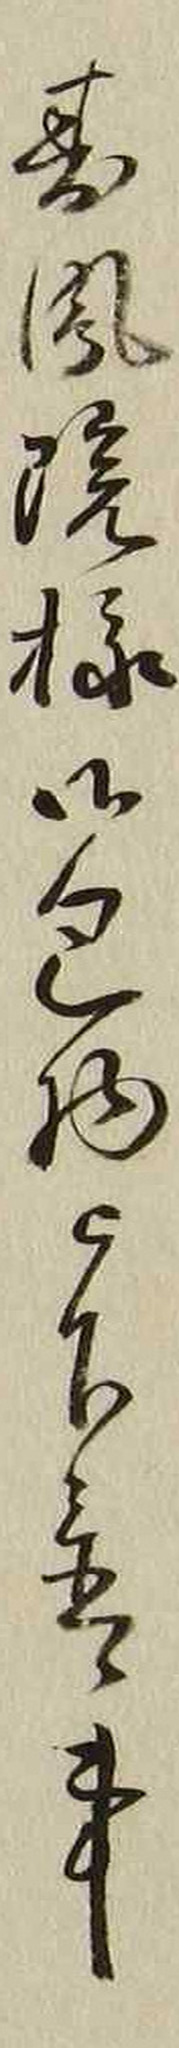寿鳳院様御包物被下置候事
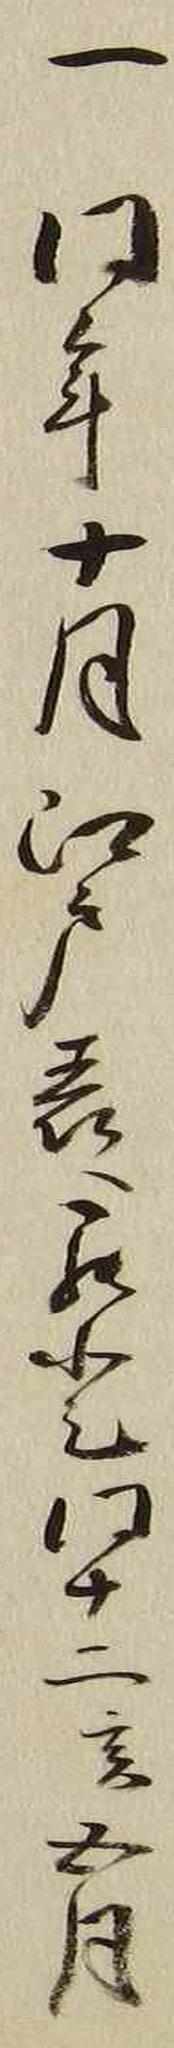一同年十月江戸表へ罷登同十二亥五月
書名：諸士系譜　巻之25　い之部25
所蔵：会津若松市立会津図書館
